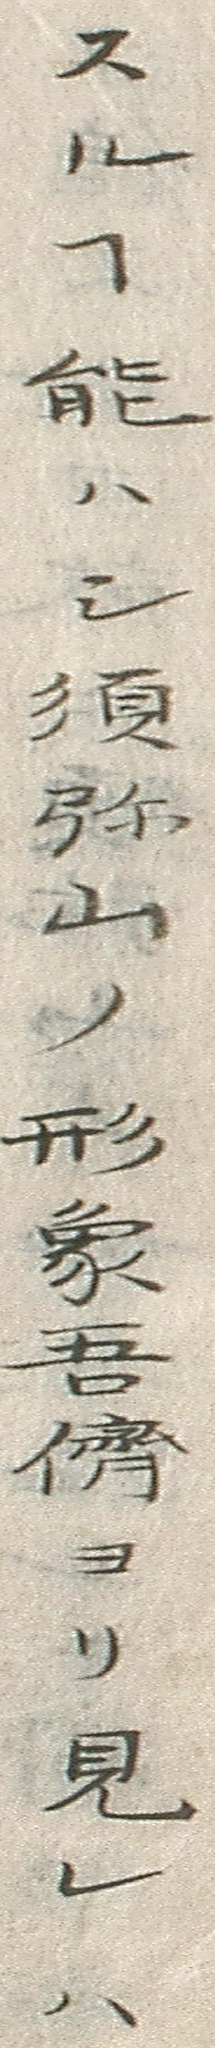スルコト能ハシ須弥山ノ形象吾儕ヨリ見レハ
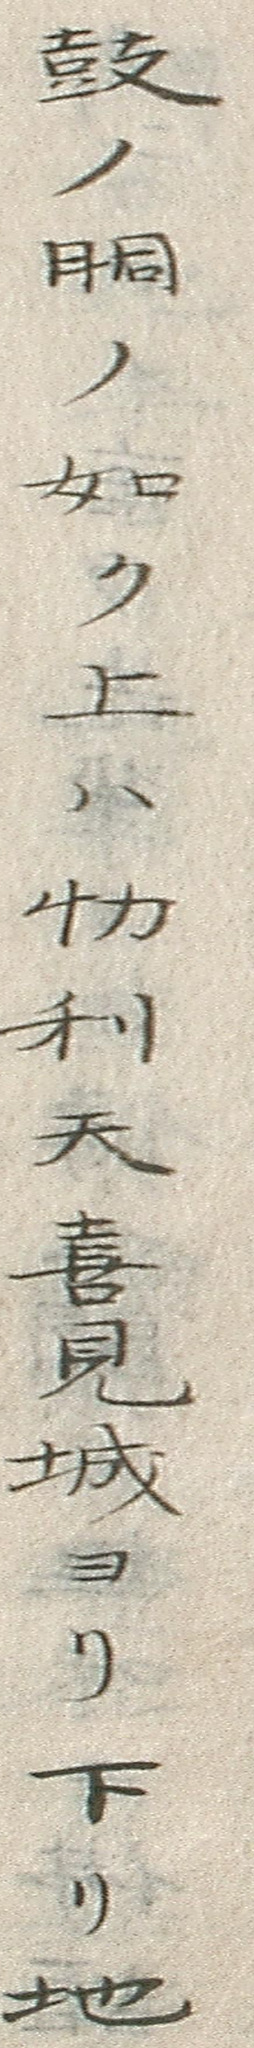鼓ノ胴ノ如ク上ハ忉利天喜見城ヨリ下リ地
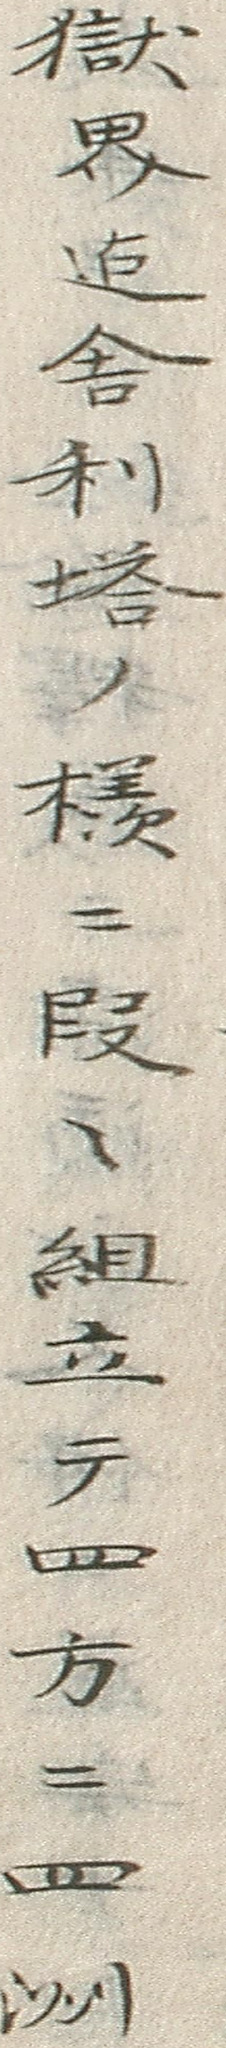獄界迠舎利塔ノ様ニ叚〻組立テ四方ニ四洲
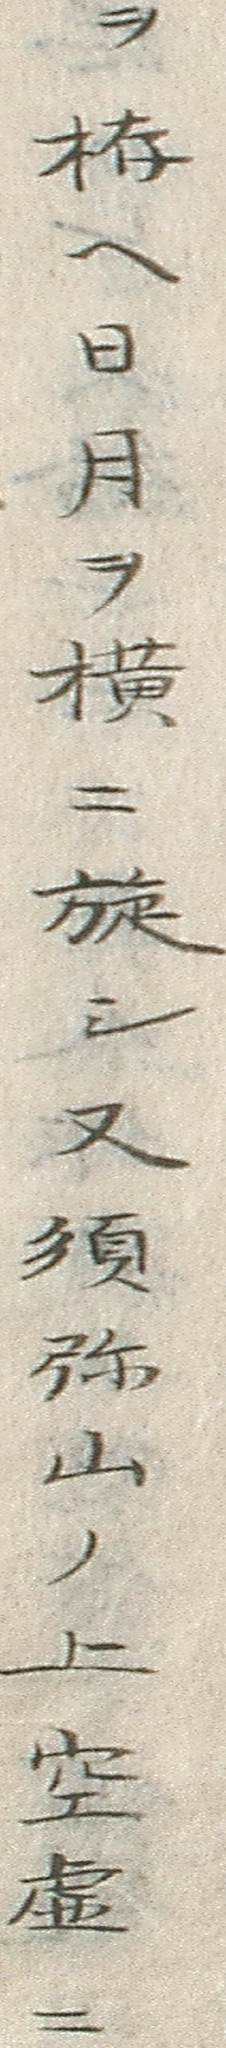ヲ拵ヘ日月ヲ横ニ旋シ又須弥山ノ上空虚ニ
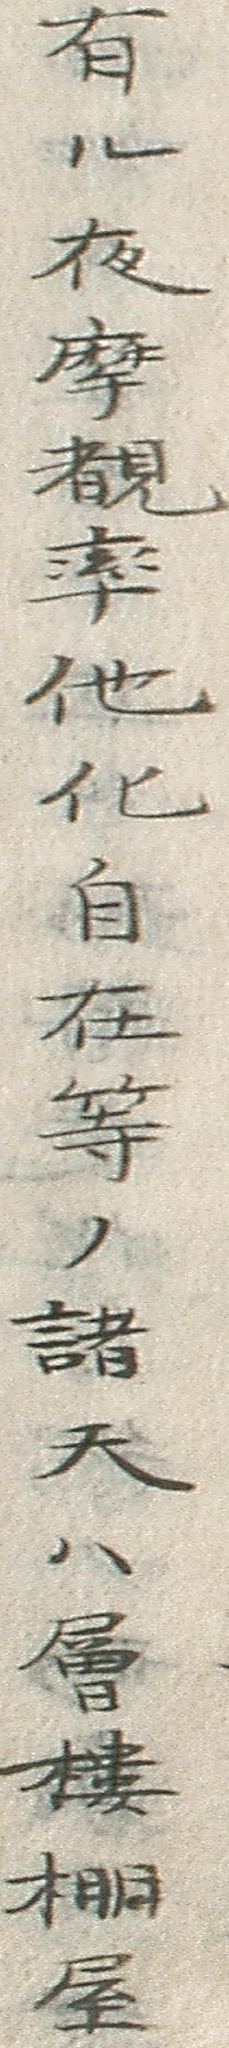有ル夜摩覩率他化自在等ノ諸天ハ層樓棚屋

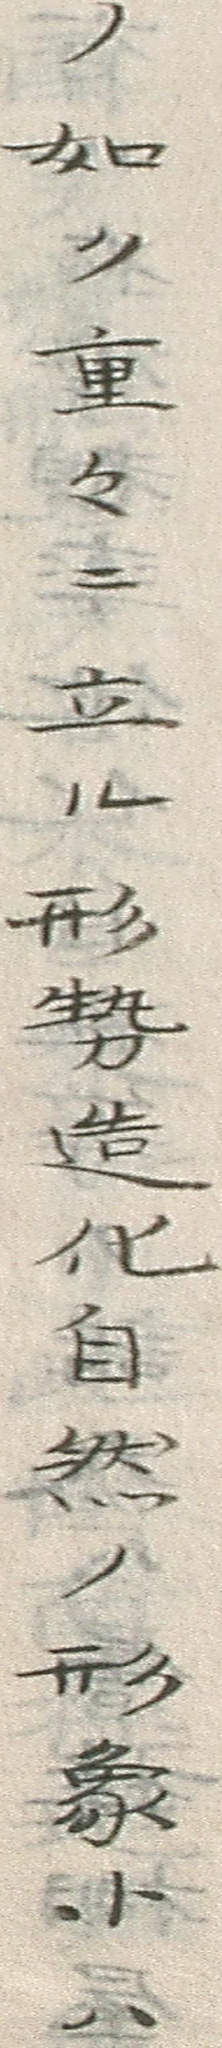ノ如ク重々ニ立ル形勢造化自然ノ形象トハ
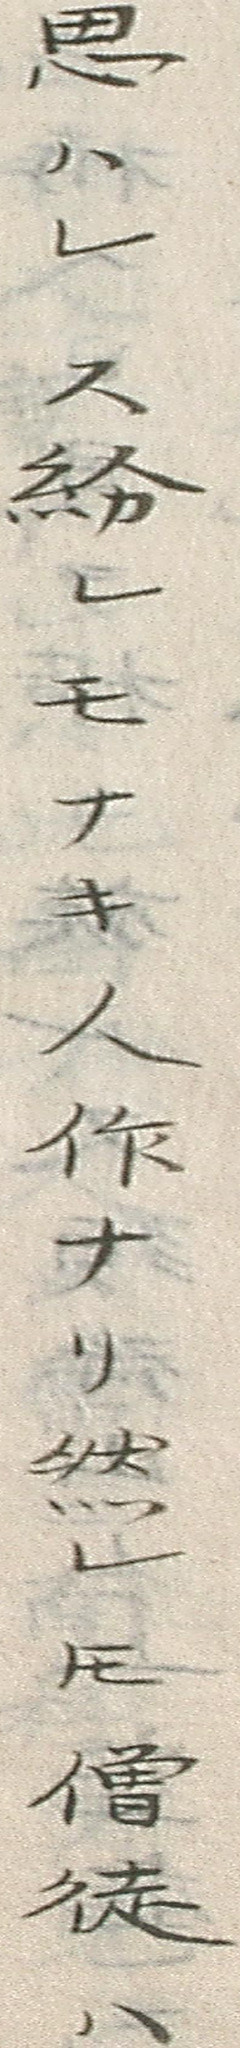思ハレス紛レモナキ人作ナリ然レトモ僧徒ハ
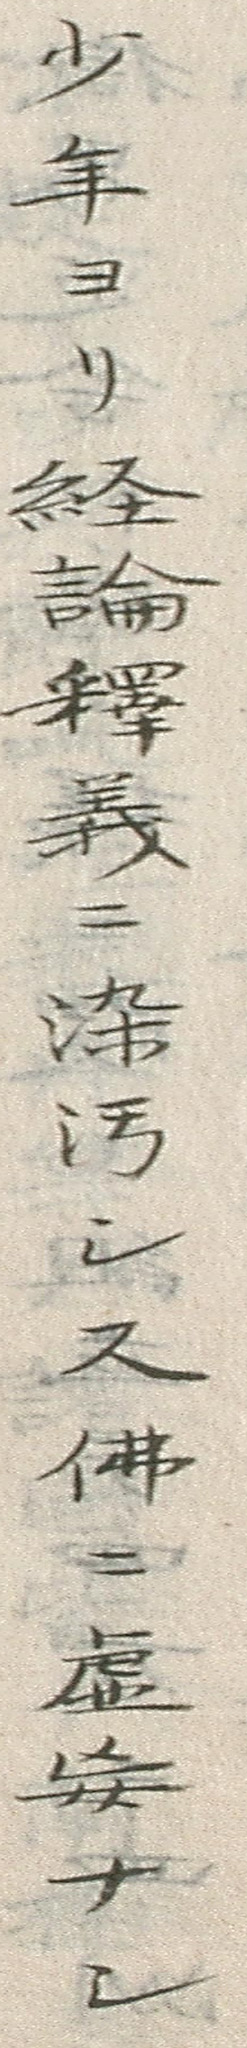少年ヨリ経論釈義ニ汚染シ又仏ニ虚妄ナシ
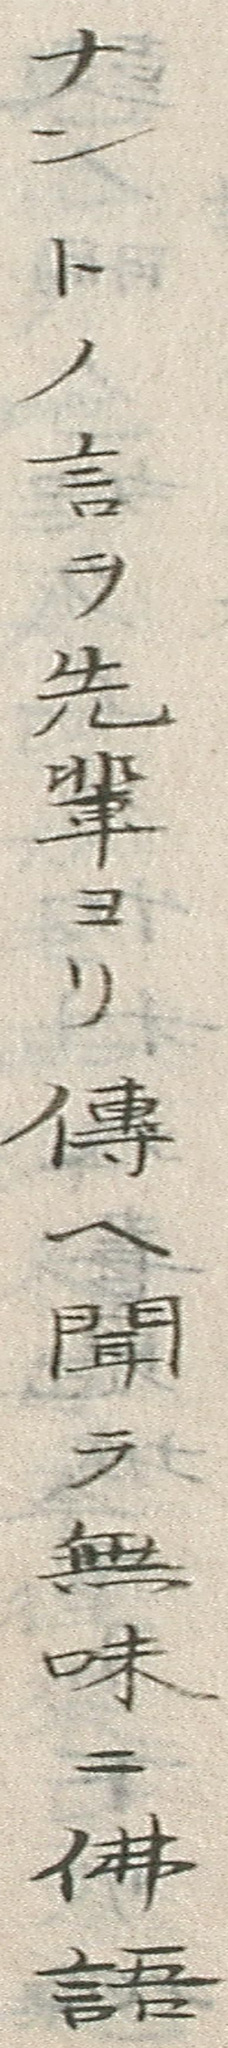ナントノ言ヲ先輩ヨリ伝ヘ聞テ無味ニ仏語
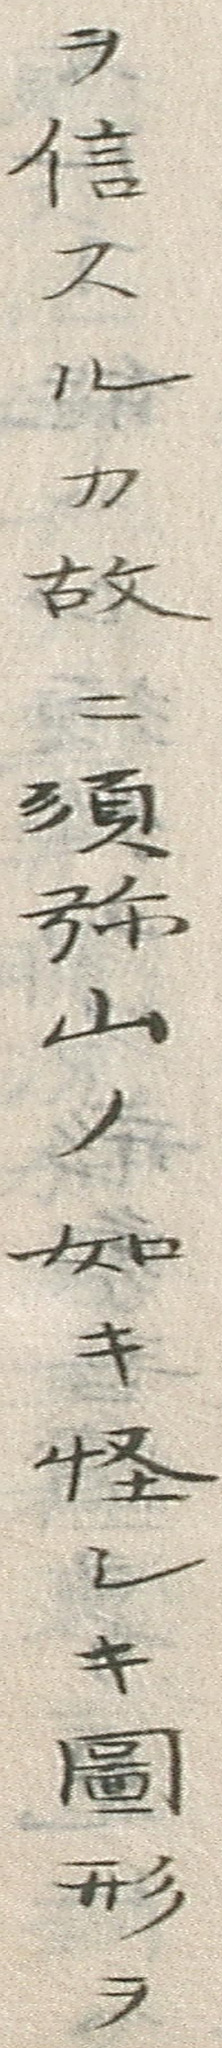ヲ信スルカ故ニ須弥山ノ如キ怪シキ図形ヲ
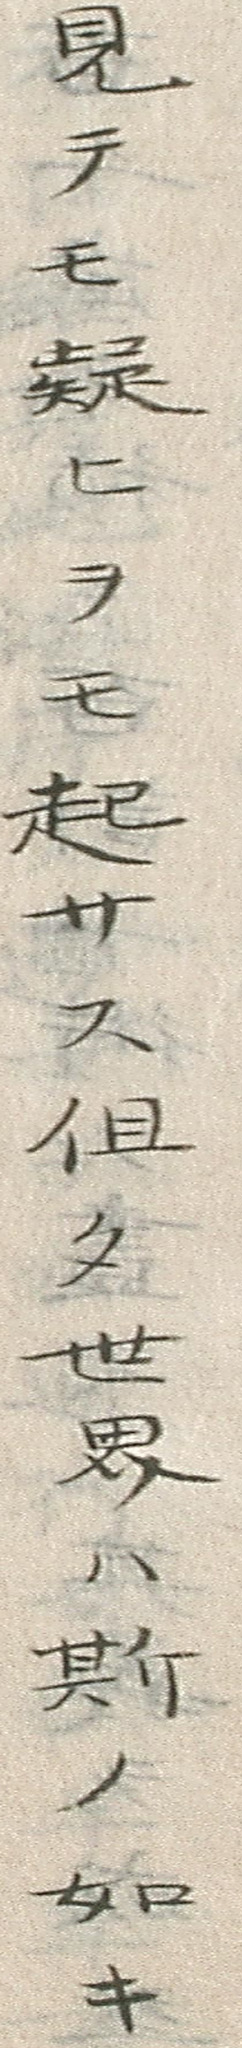見テモ疑ヒヲモ起サス但タ世界ハ斯ノ如キ
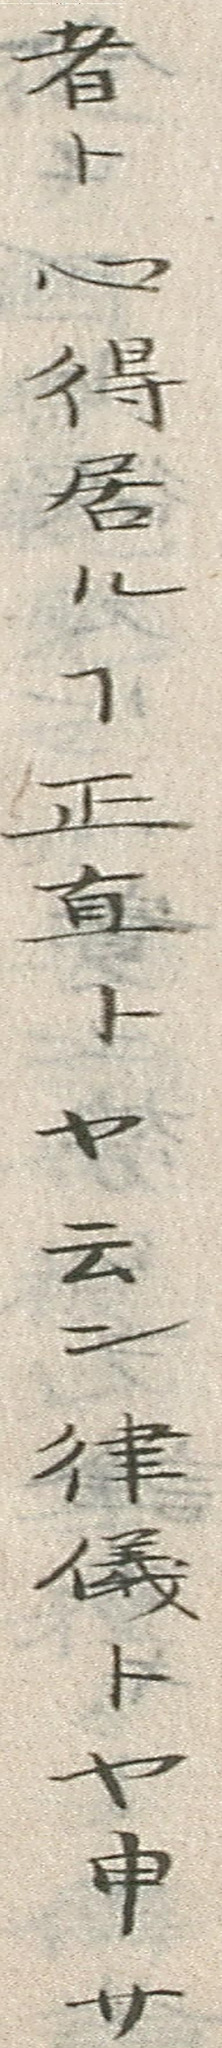者ト心得居ルコト正直トヤ云ン律儀トヤ申サ
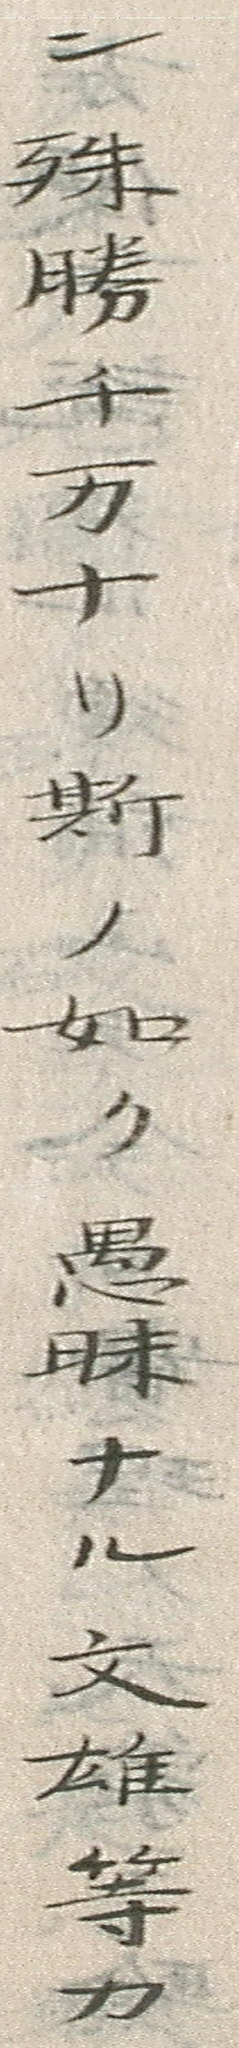ン殊勝千万ナリ斯ノ如ク愚昧ナル文雄等カ
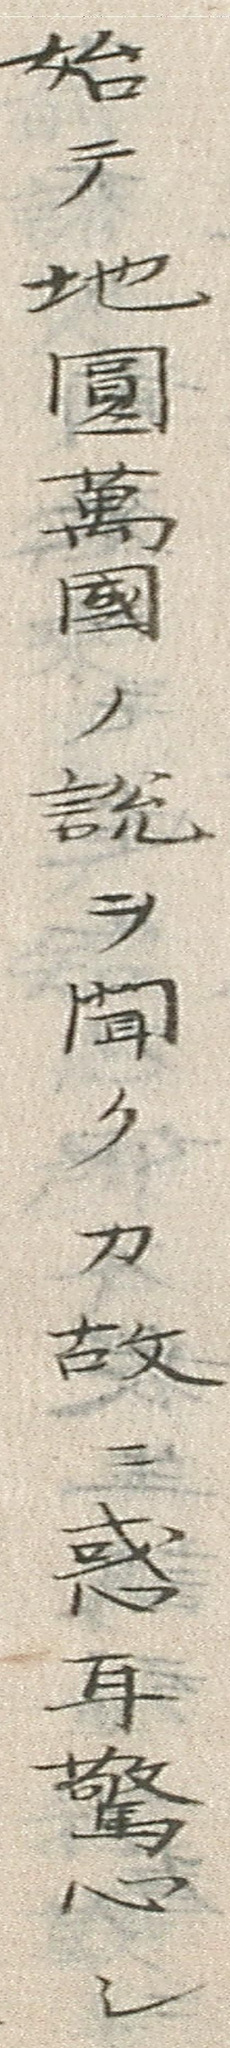始テ地円万国ノ説ヲ聞クカ故ニ惑耳驚心シ
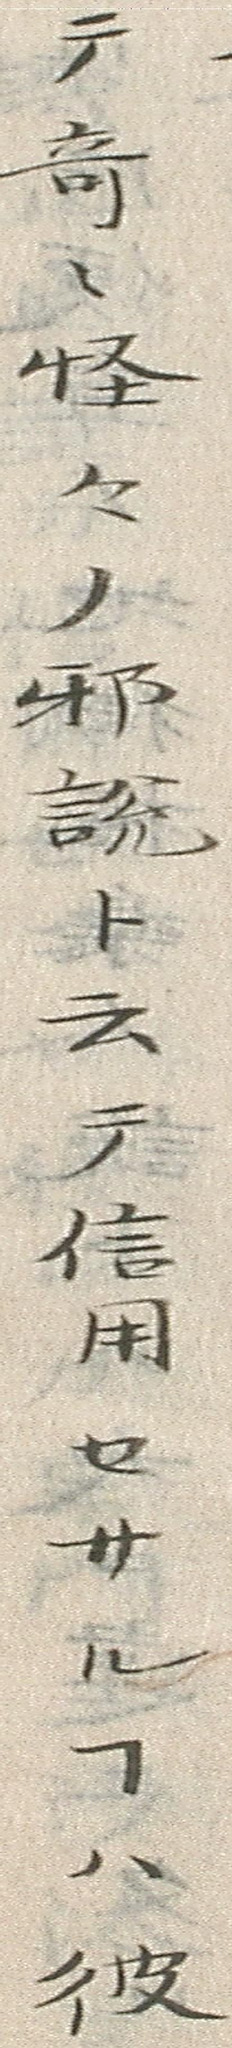テ奇〻怪々ノ邪説ト云テ信用セサルコトハ彼
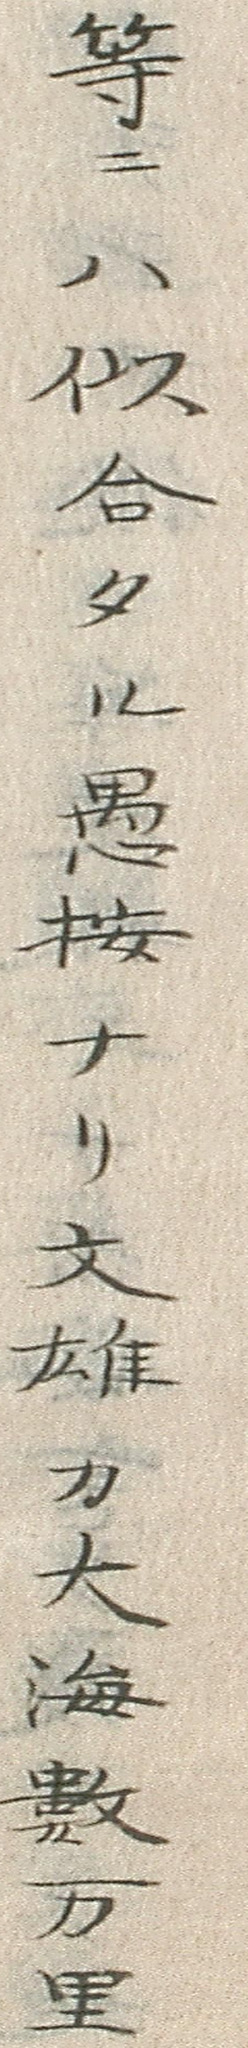等ニハ似合タル愚按ナリ文雄カ大海数万里
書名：天學略名目羽翼　全
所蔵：東京大学地震研究所図書室 Earthquake Research Institute Library, The University of Tokyo, JAPAN
